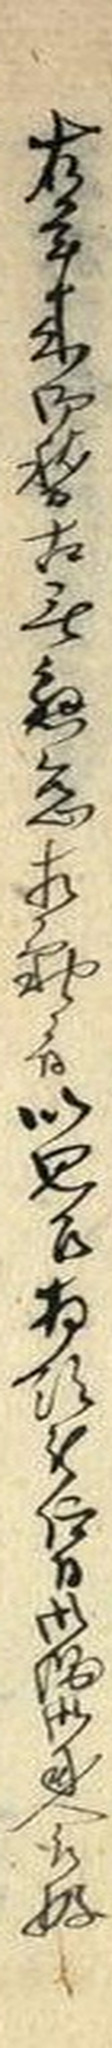右年来御稽古無懈怠相勤候ニ付以思召拝領被仰付御側御用人取扱
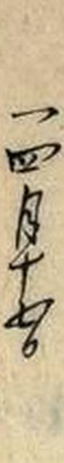一四月十五日
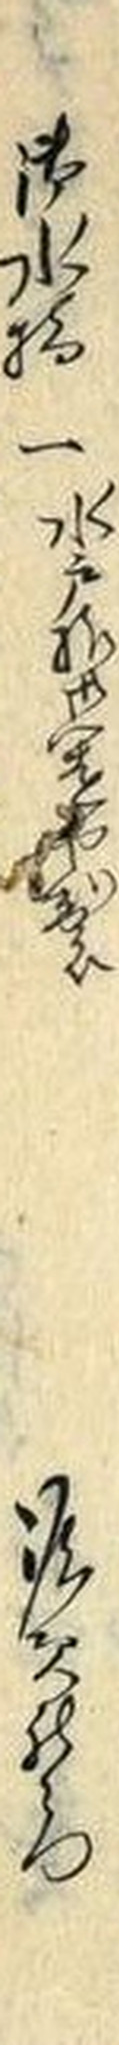御水指一水戸様御園中製渥美新右衛門
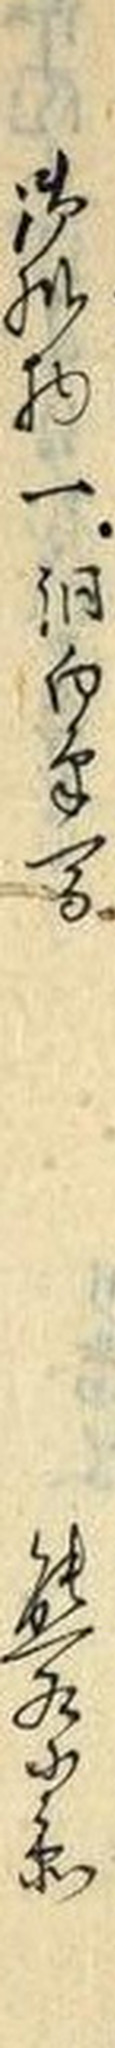御掛物一泪白鳥写？熊谷小兵衛

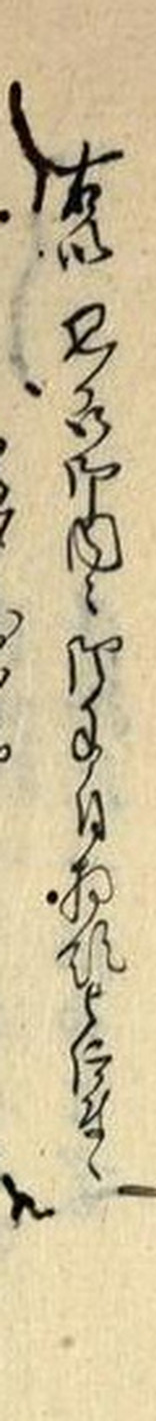右以思召御内々御手自拝領被仰付候
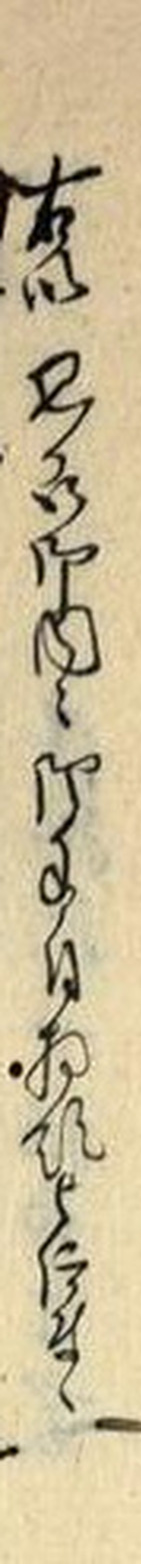右以思召御内々御手自拝領被仰付候
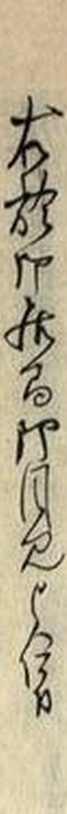右於御居間御目見被仰付
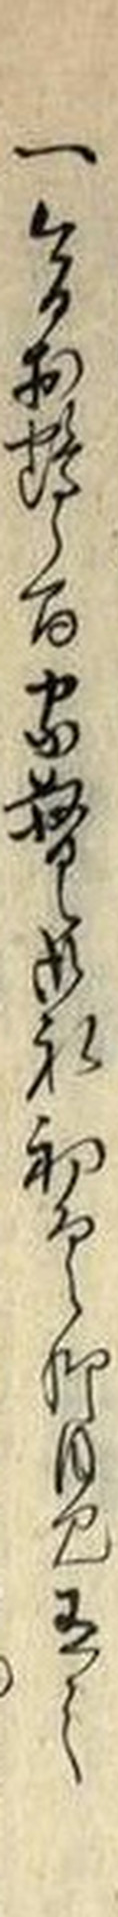一今日於鶴之間家督之御礼初而之御目見有之
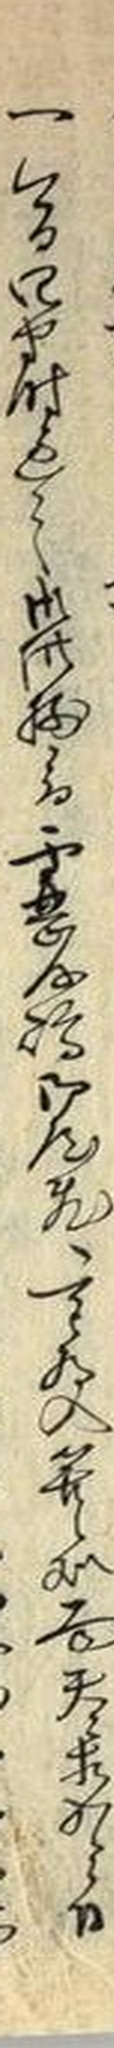一今日四半時過之御供揃ニ而霊岸嶋御屋敷へ可被為入筈之処雨天ニ相成候ニ付
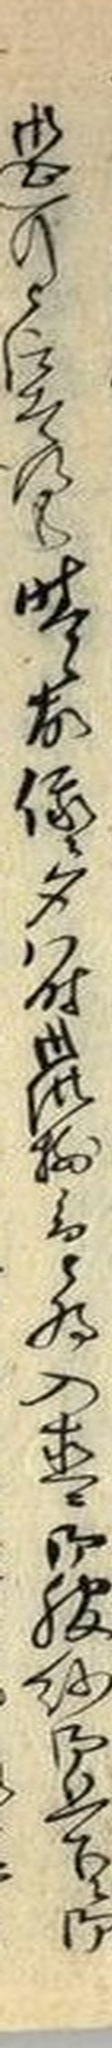御延引被仰出候得共晴候故俄ニ夕八時御供揃ニ而被為入直ニ御服紗御上下ニ御
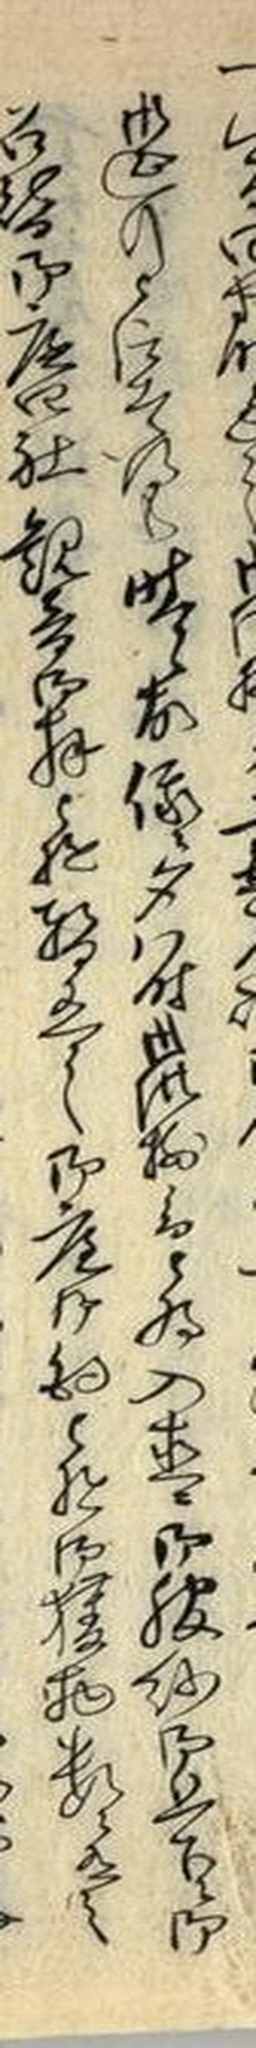召替御庭四社観音御拝被遊暫有之御庭御釣被遊御獲物数々有之
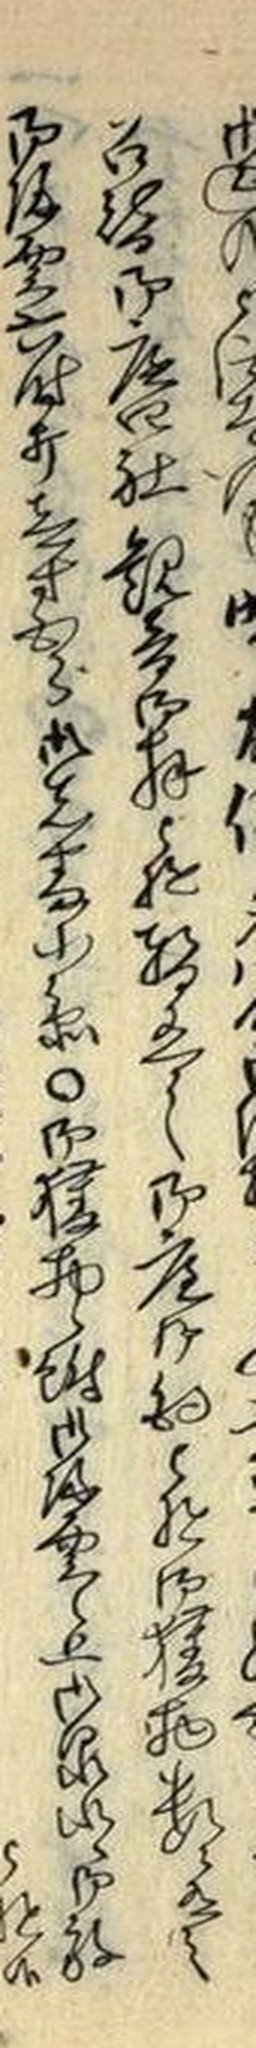御帰殿六時打壱寸五分御先番小兵衛〇御獲物之鮒御帰殿之上御泉水へ御放被遊候
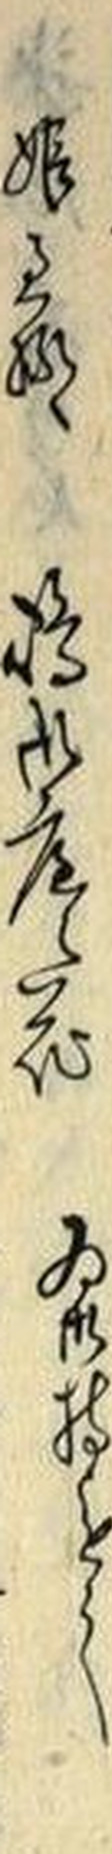姫君様へ嶋御庭之花為御持被進之
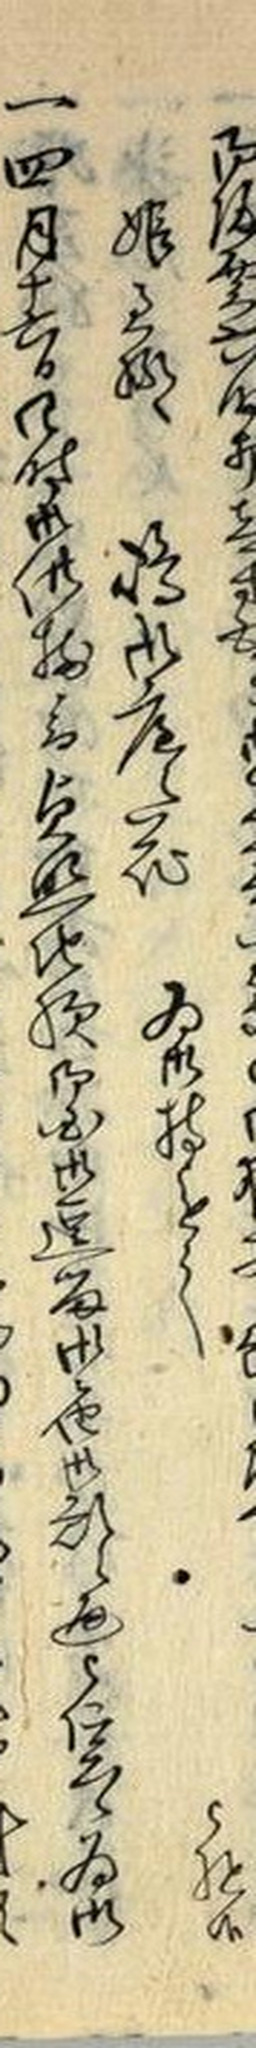一四月十六日四時御供揃ニ而貞照院様御国御逗留御届御願之通被仰出候為御
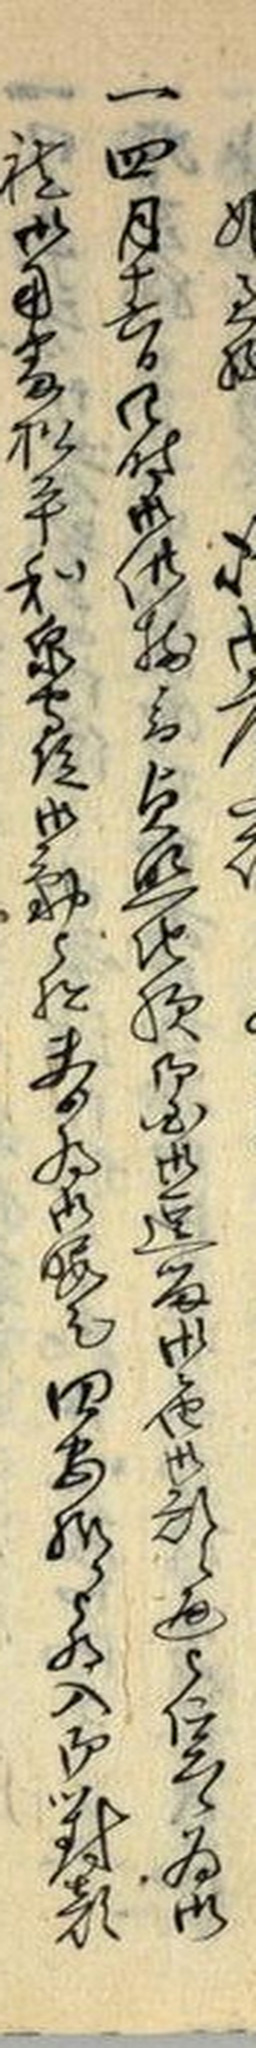礼御用番松平和泉守殿御勤被遊夫ゟ為御暇乞田安様へ被為入御対顔
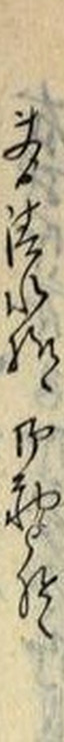夫ゟ清水様へ御勤被遊候
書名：少傅日録抄（斉承付側向頭取日記、在府）
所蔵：福井県文書館 Fukui Prefectural Archives
